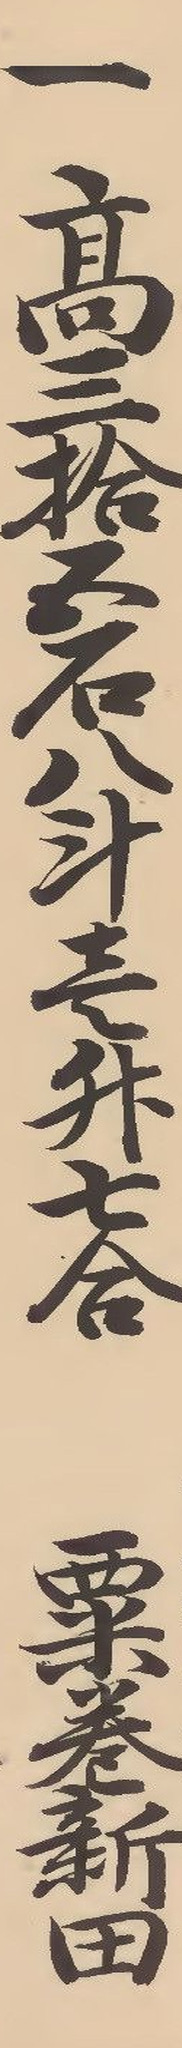一高三拾五石八斗壱升七合粟巻新田
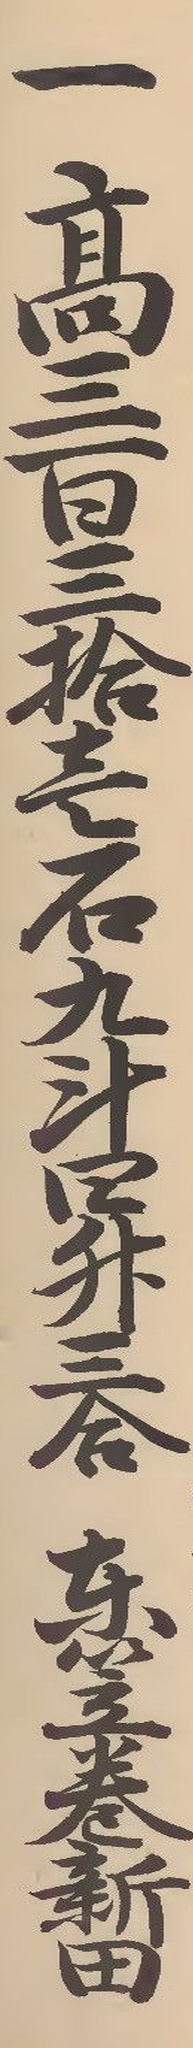一高三百三拾壱石九斗四升三合東笠巻新田
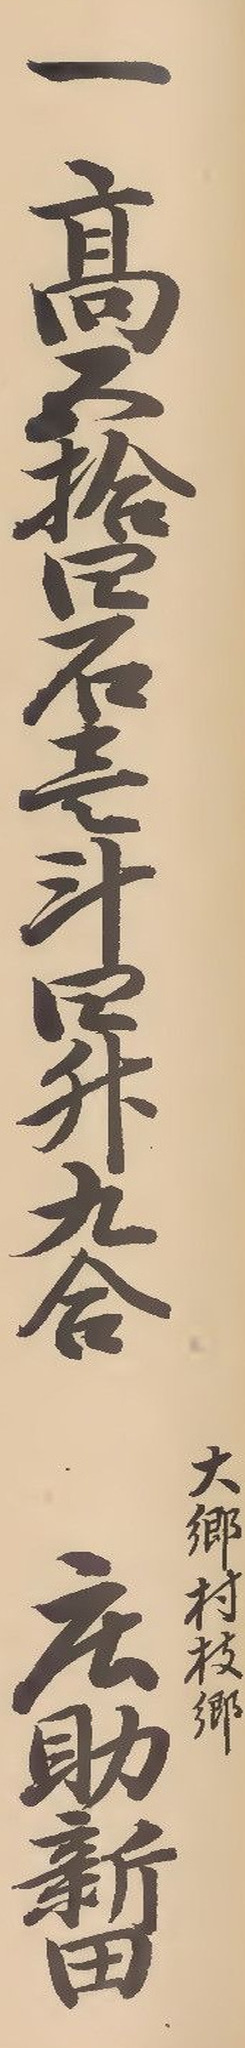一高五拾四石壱斗四升九合庄助新田
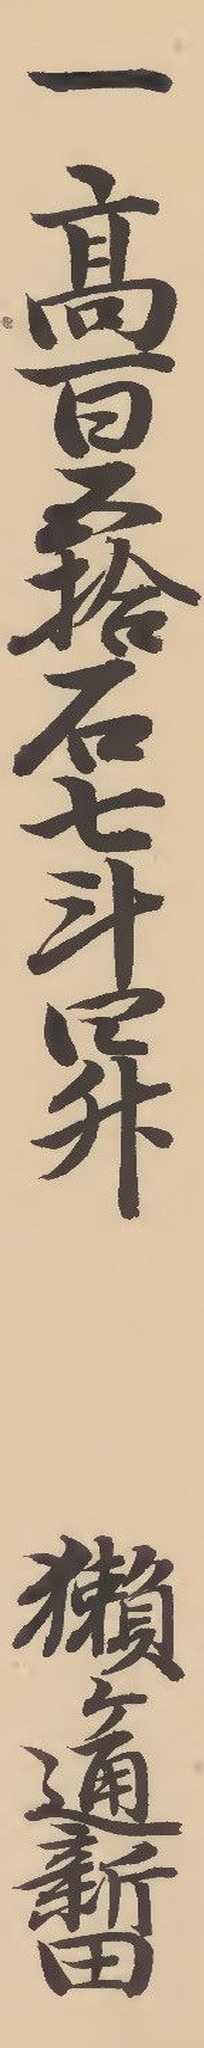一高百五拾石七斗四升獺ヶ通新田
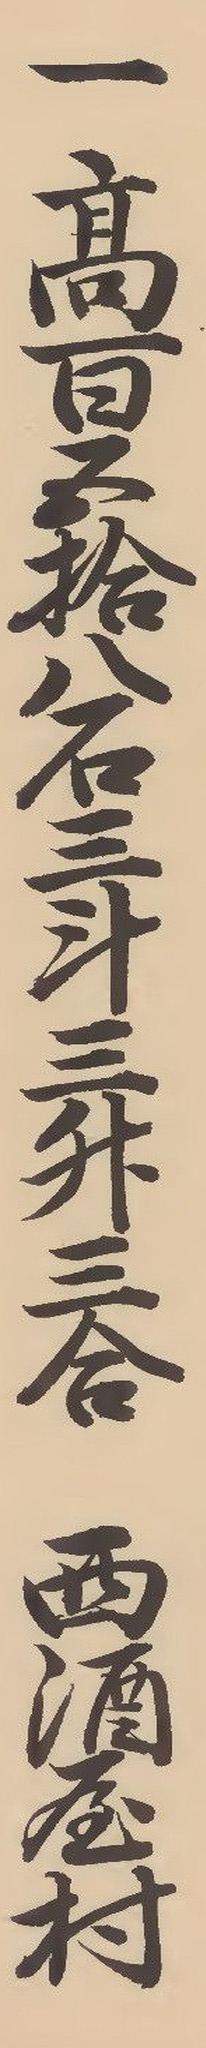一高百五拾八石三斗三升三合西酒屋村
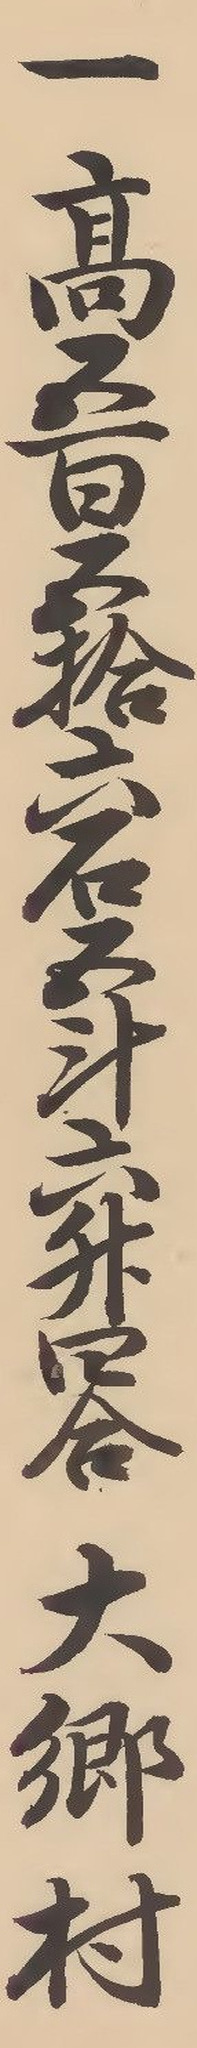一高五百五拾六石五斗六升四合大郷村

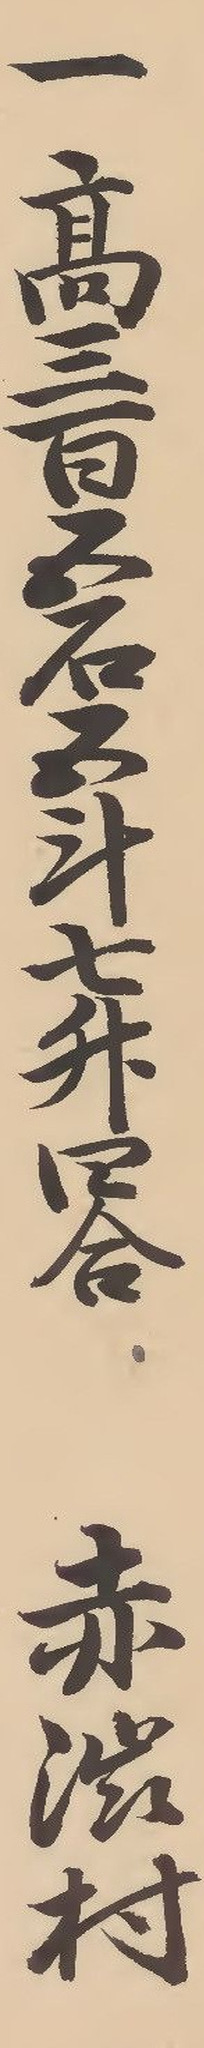一高三百五石五斗七升四合赤渋村
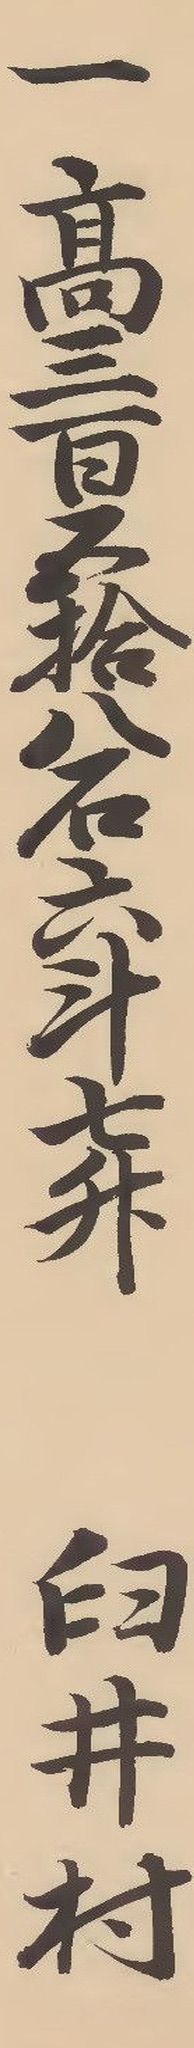一高三百五拾八石六斗七升臼井村
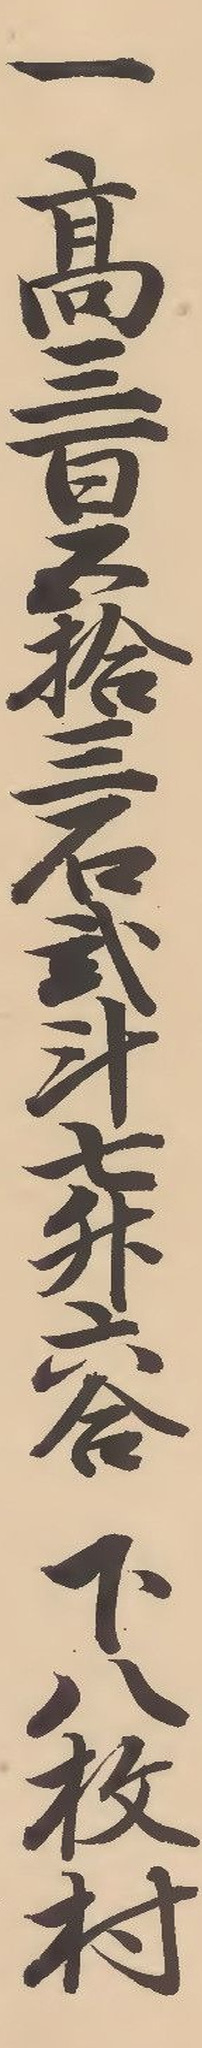一高三百五拾三石弐斗七升六合下八枚村
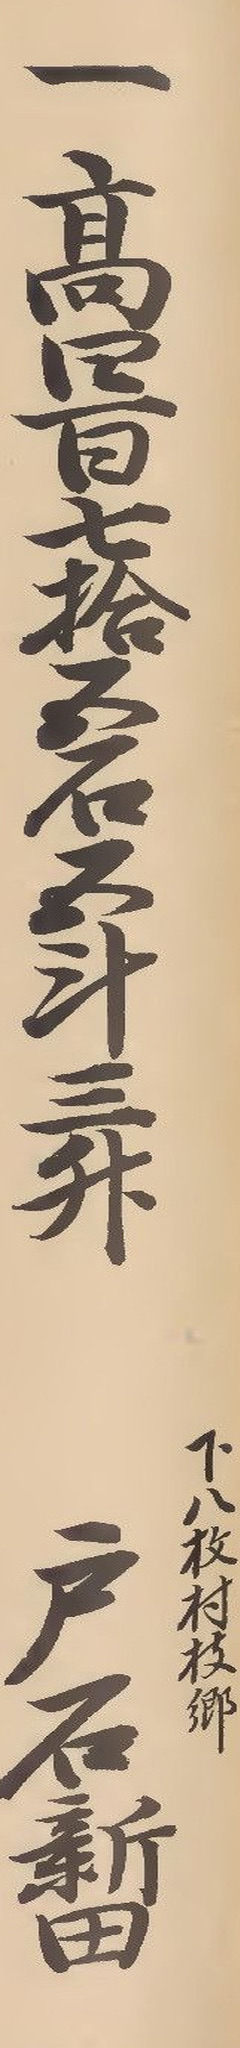一高四百七拾五石五斗三升戸石新田
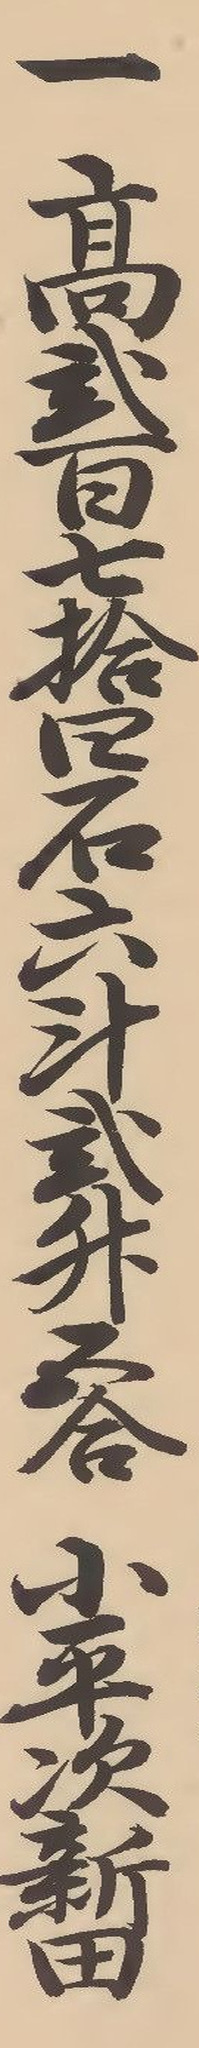一高弐百七拾四石六斗弐升五合小平次新田
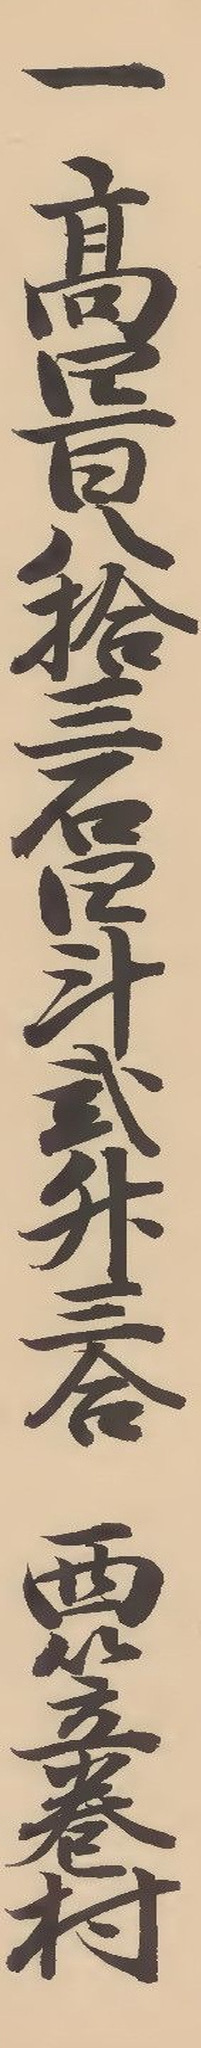一高四百八拾三石四斗弐升三合西笠巻村
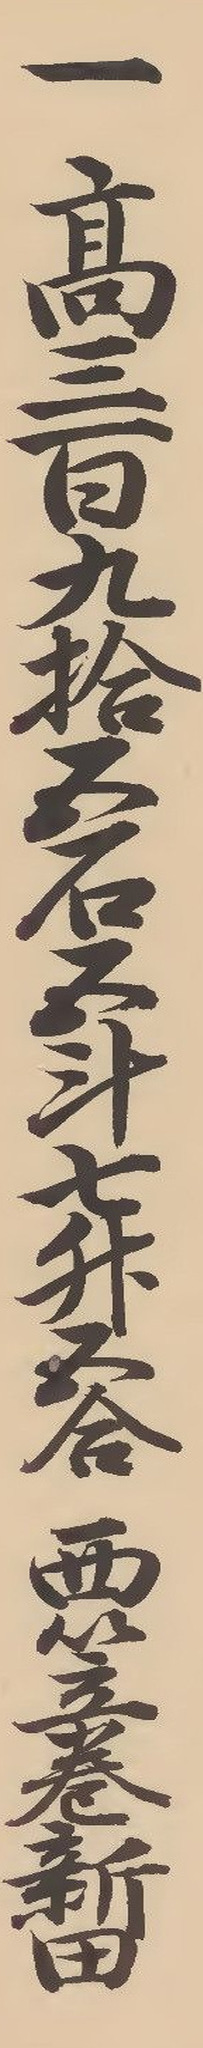一高三百九拾五石五斗七升五合西笠巻新田

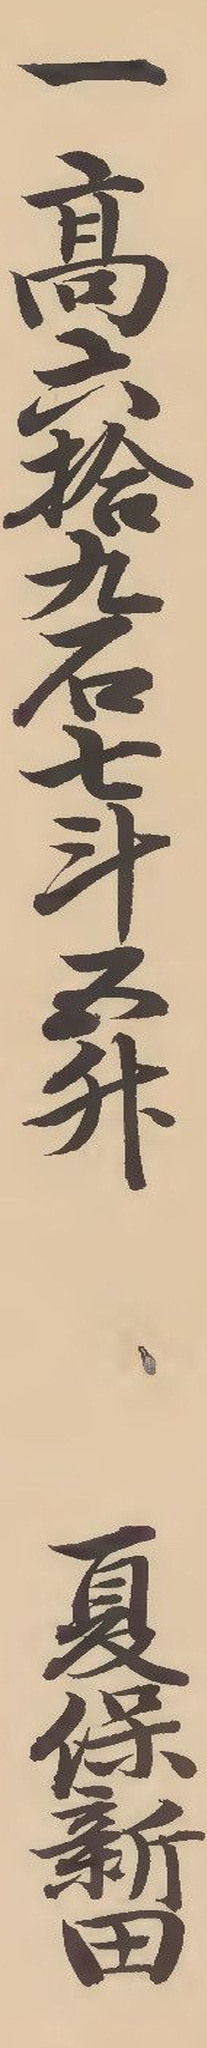一高六拾九石七斗五升夏保新田
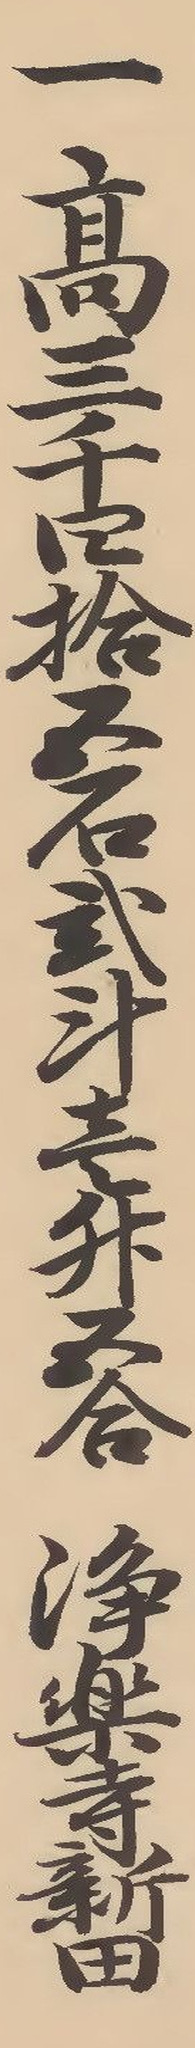一高三千四拾五石弐斗壱升五合浄楽寺新田
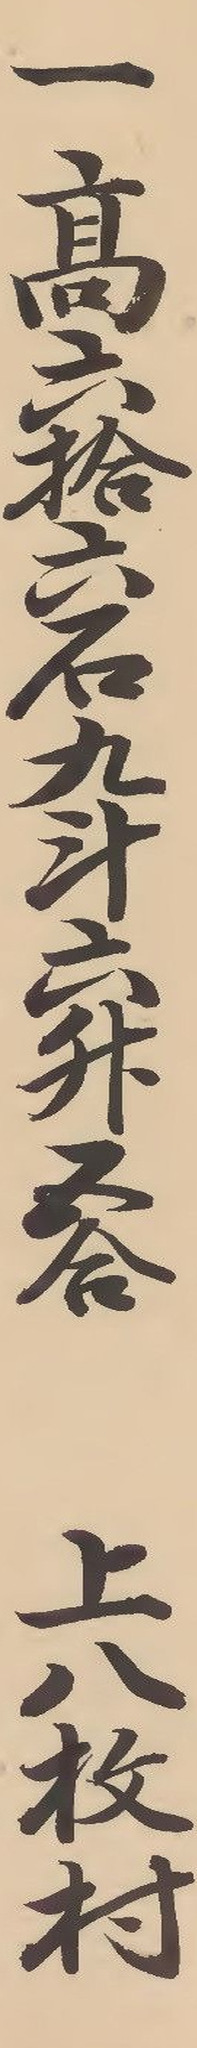一高六拾六石九斗六升五合上八枚村
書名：越後国郷帳　下
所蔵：国立公文書館 National Archives of Japan
